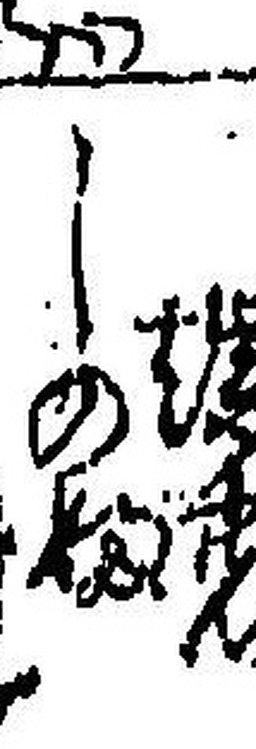しのふ
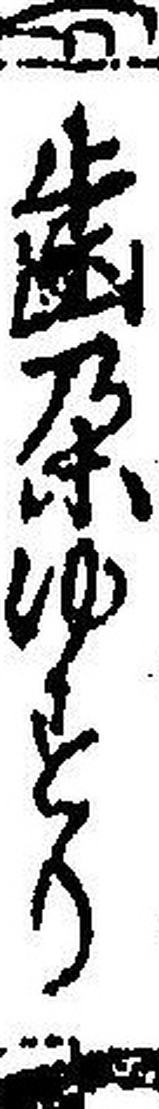歯朶ゆすり
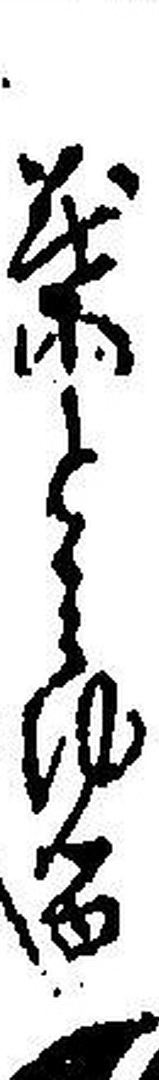葉とみゆる
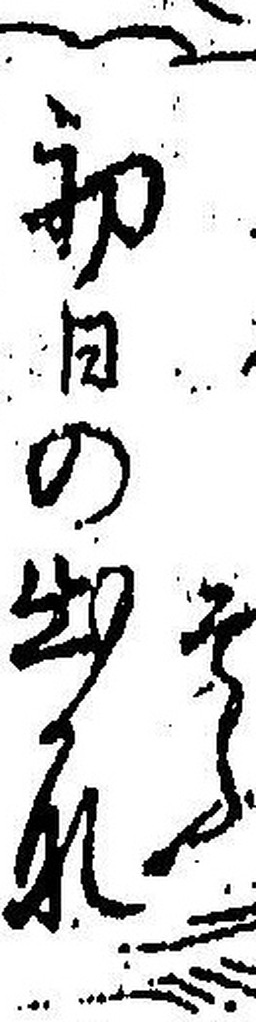初日の出かな
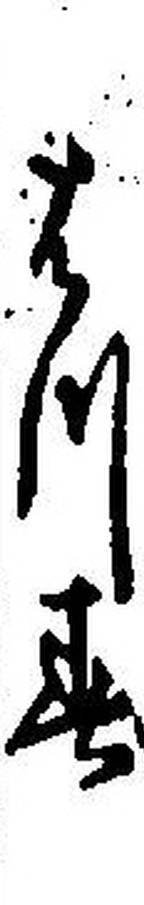はつ春
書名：どうれ百人一首 / 鹿都部真顔(狂歌堂)編
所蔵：東京大学総合図書館 General Library in the University of Tokyo, JAPAN
